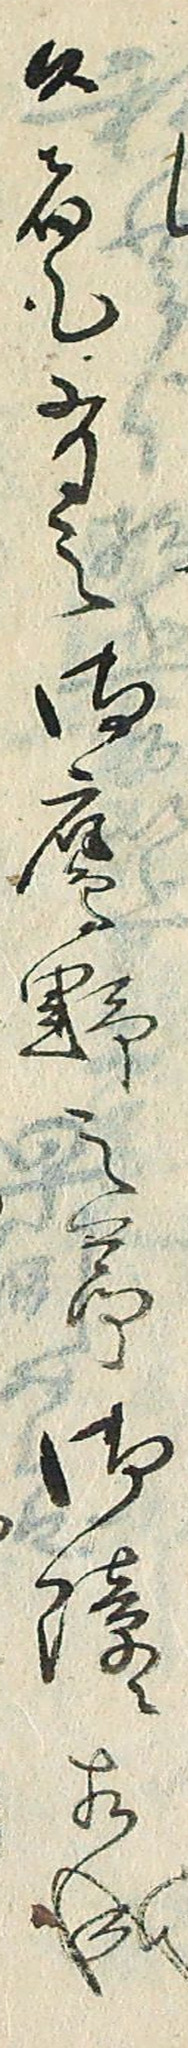候者も有之御鷹野之節御障に相成り
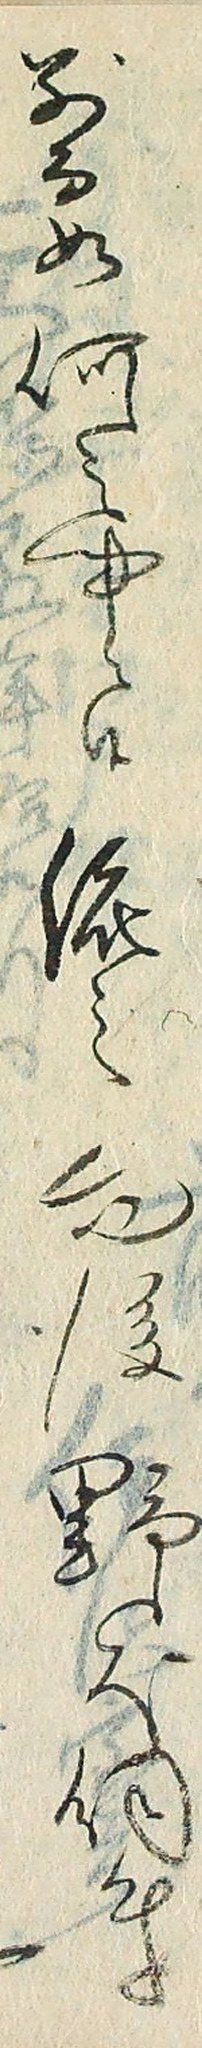別而如何之事に候依之向後野犬飼付
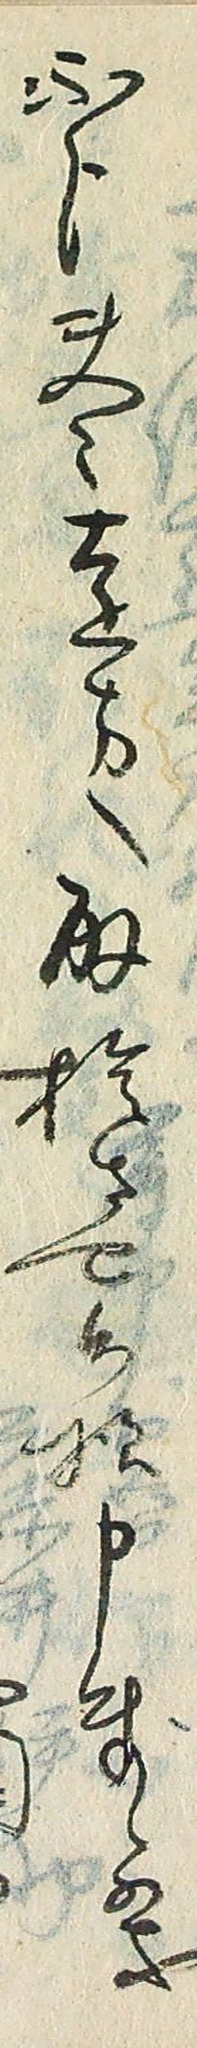不申候夫々遠方へ取捨させ候様申付候条
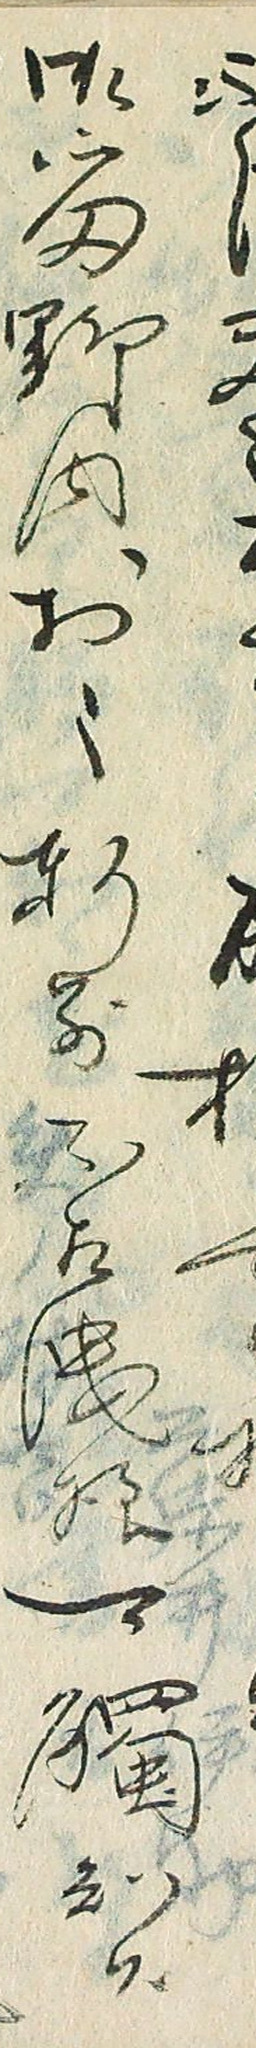御留野内村々軒別不相洩様可触知候
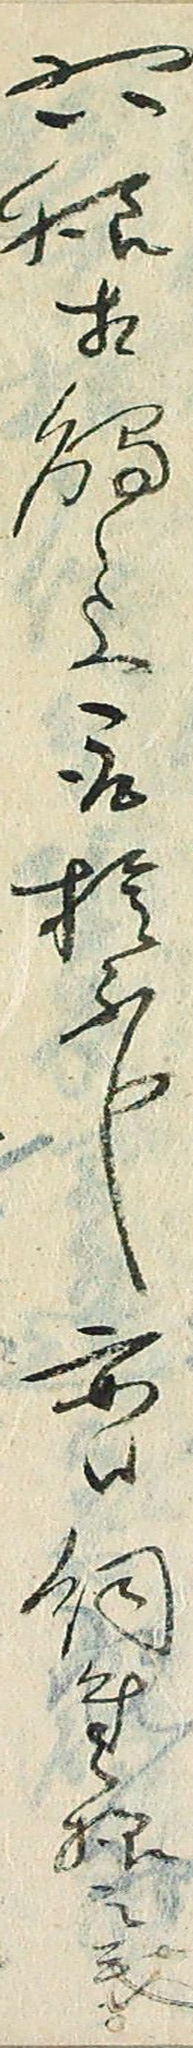右様相触之上取捨不申亦は飼付候様之義
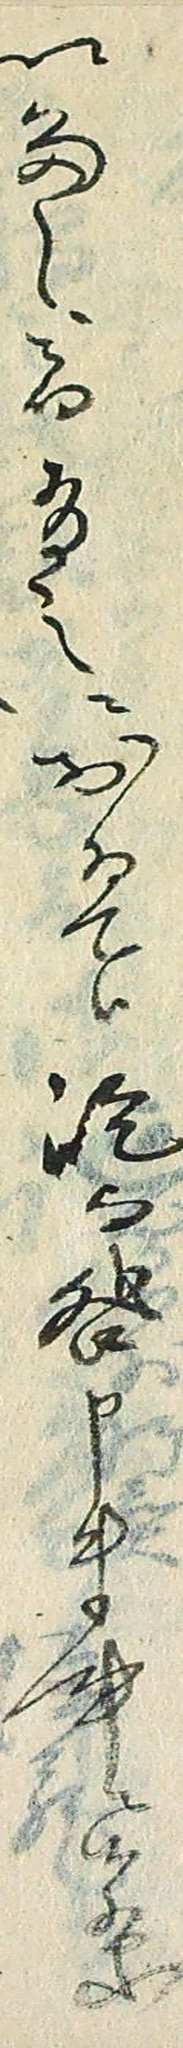いたし候者有之におゐては屹と咎申付事に候条
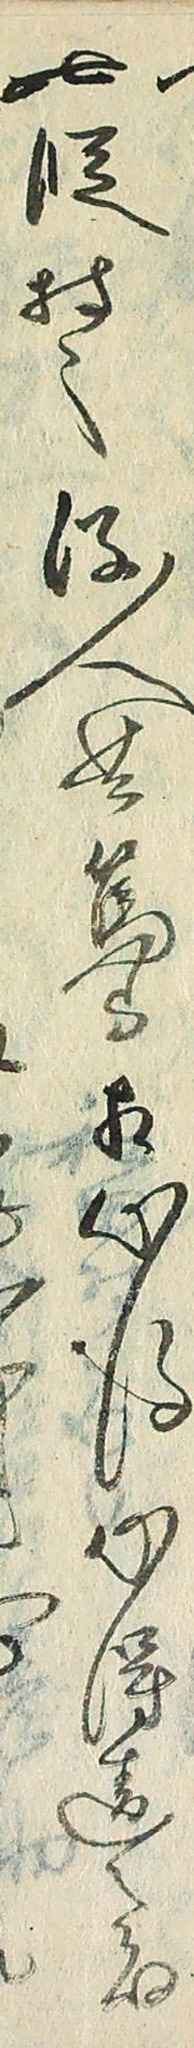此段村々役人共篤と相心得心得違之者
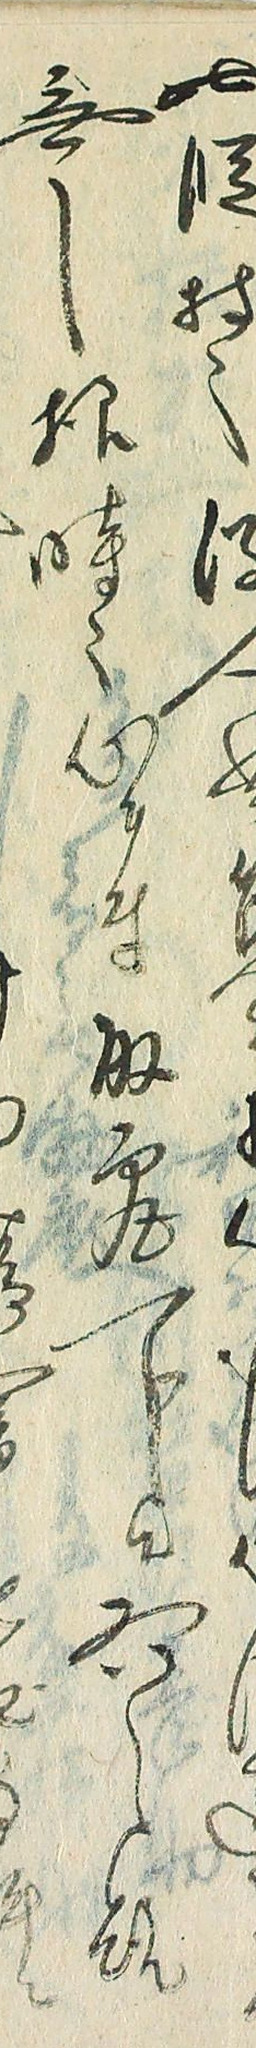無之様時々心を付取究可申候右之趣
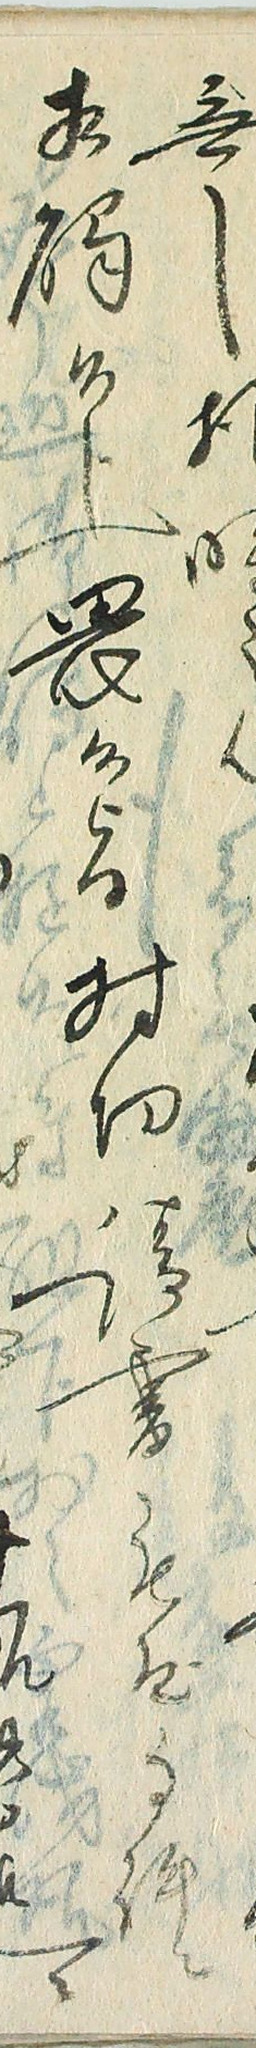相触候上畏候旨村切請書庄屋手許に
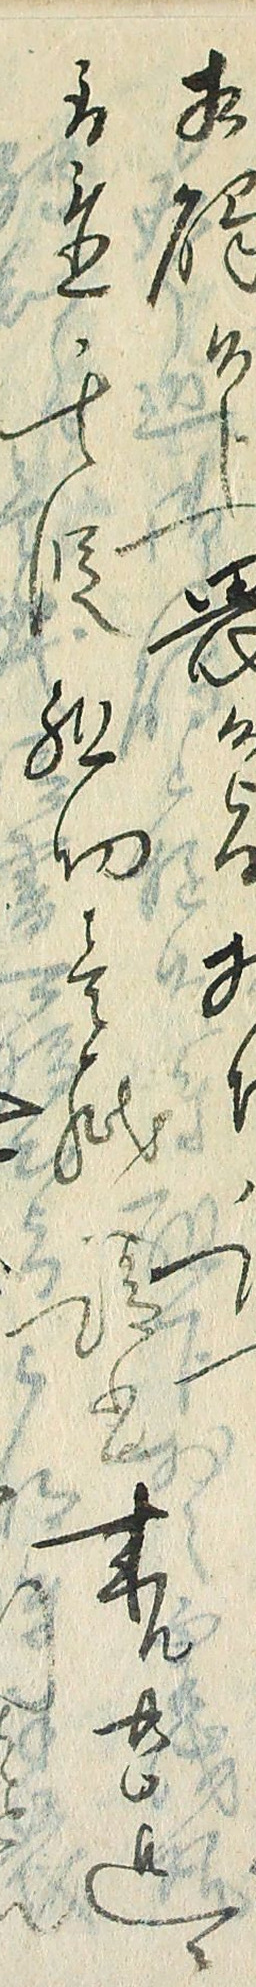取置其段組切壱紙請書来る廿日迄に
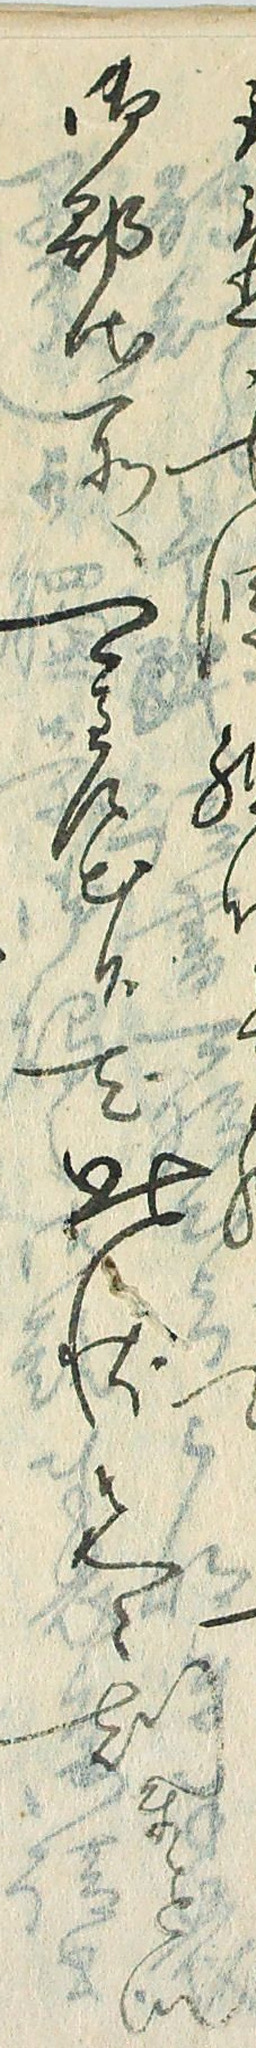御郡代所へ可差出候尤此状先々刻付を以
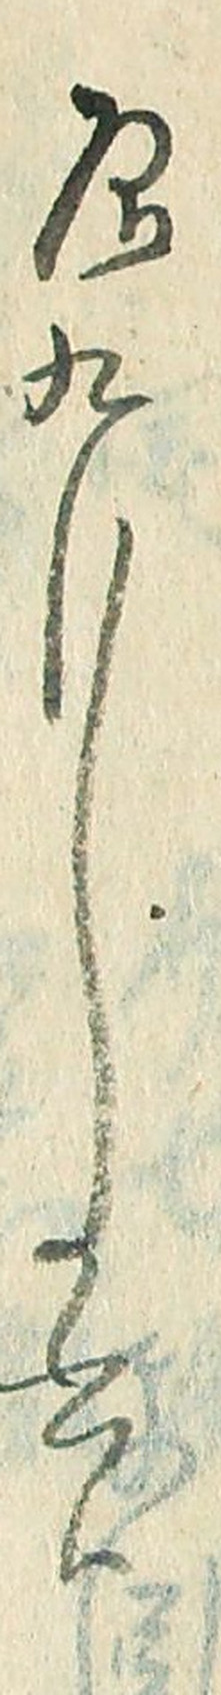辰九月六日

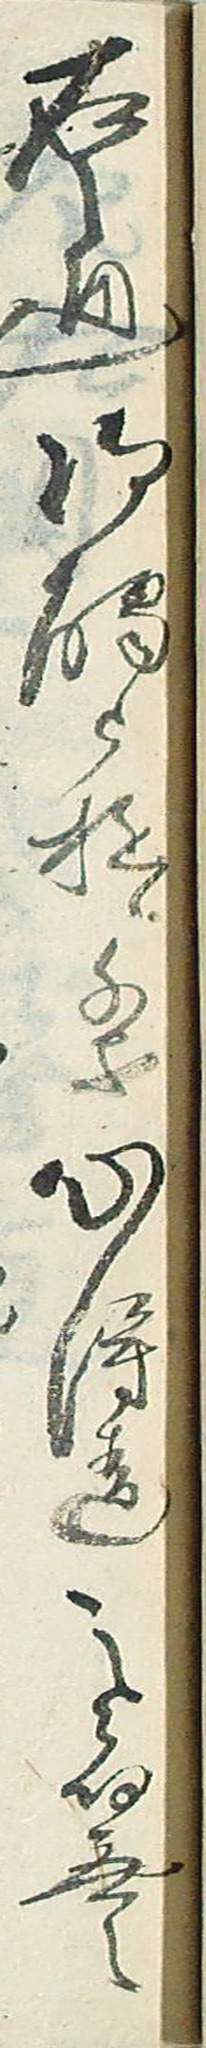右之通御触被遊候条心得違之者無之
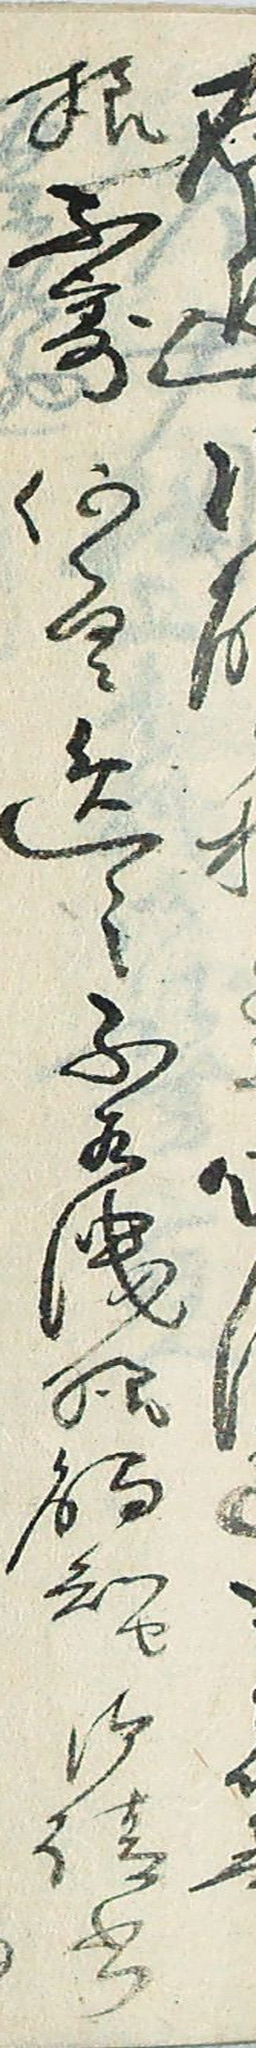様不寄何者に逸々不相洩様触知せ御請書
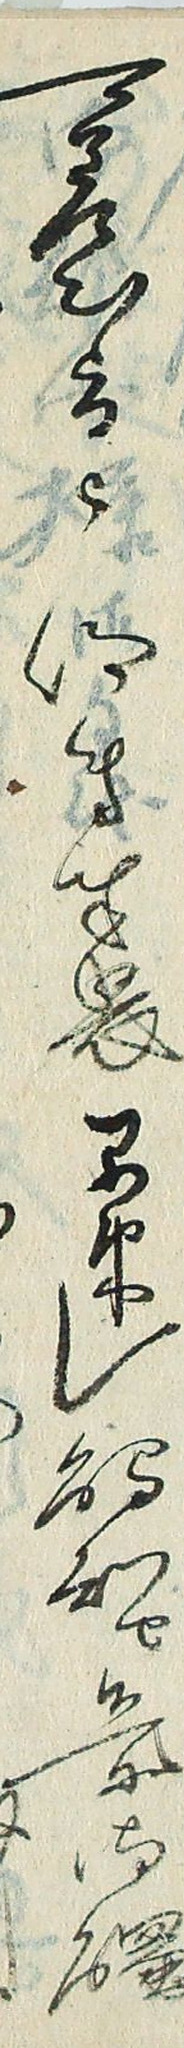可差出旨被仰付奉畏早速触知せ候所御触
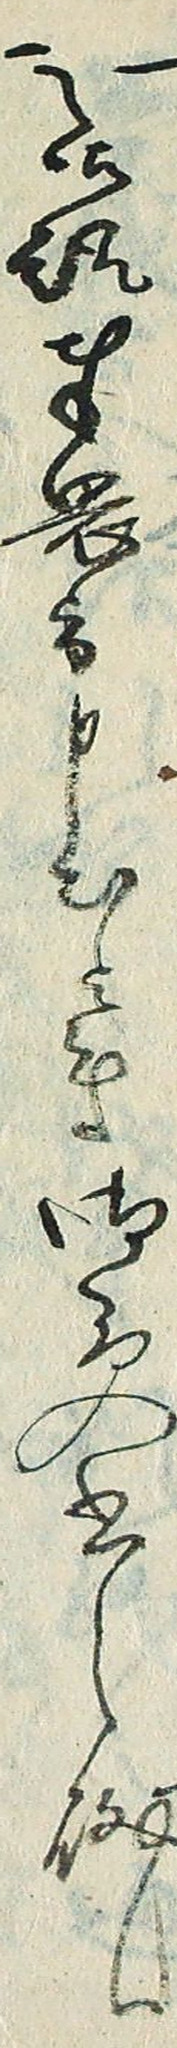之御趣奉畏旨申出候に付御受書之儀は
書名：諸御用御□受書控
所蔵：鳴門教育大学 Naruto University of Education
